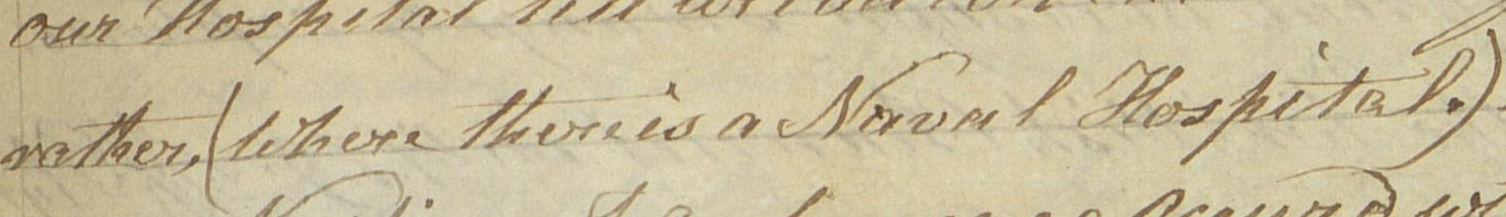rather (Where there is a Naval Hospital.)
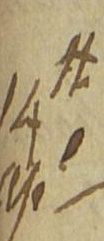14^th
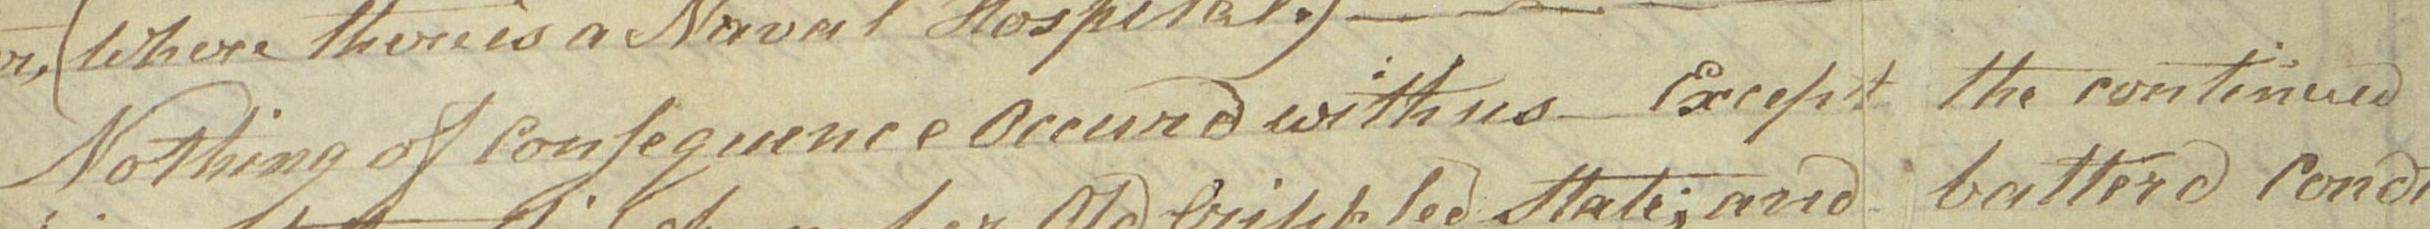Nothing of Consequence Occured with us Except the continued
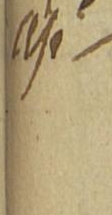Apr^l
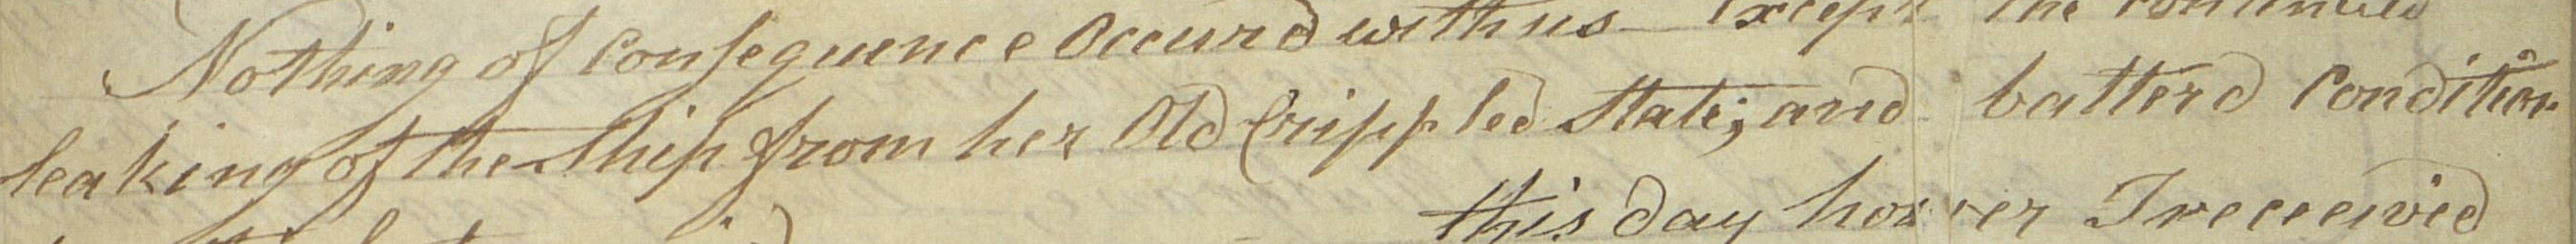leaking of the Ship from has Old Crippled State; and batterd condition
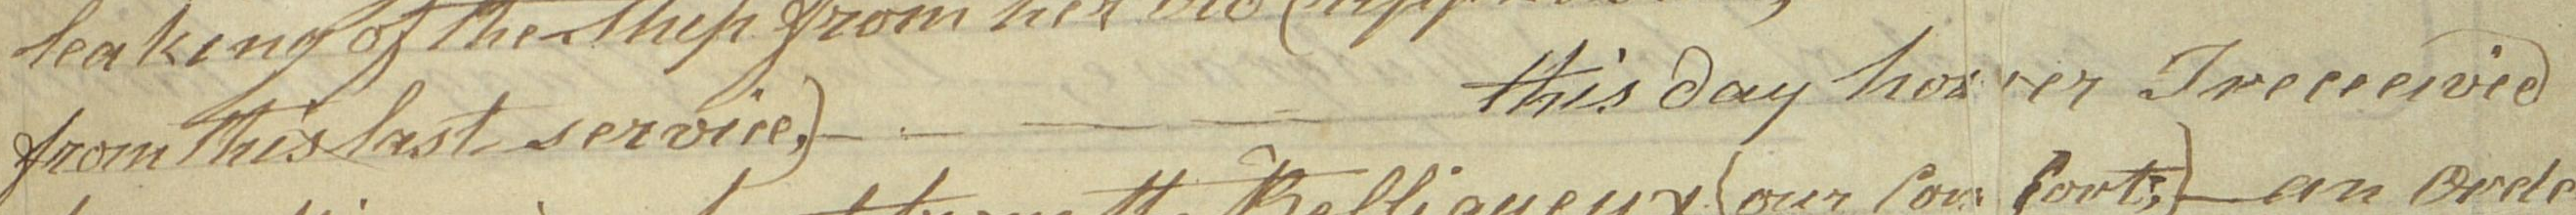from this last service,) This day how- -er I received
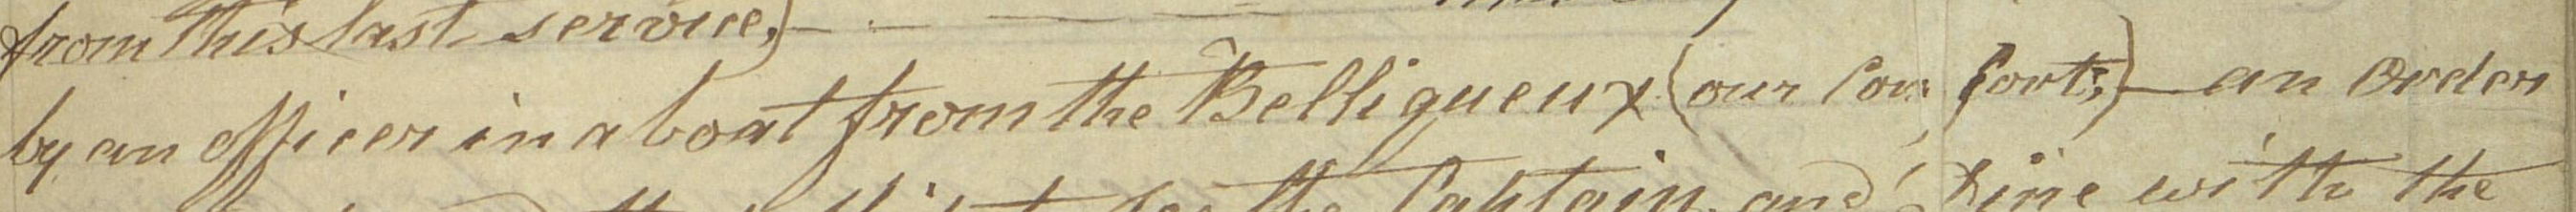by an officer in a boat from the Belliqueux (our Con Cort;) an order
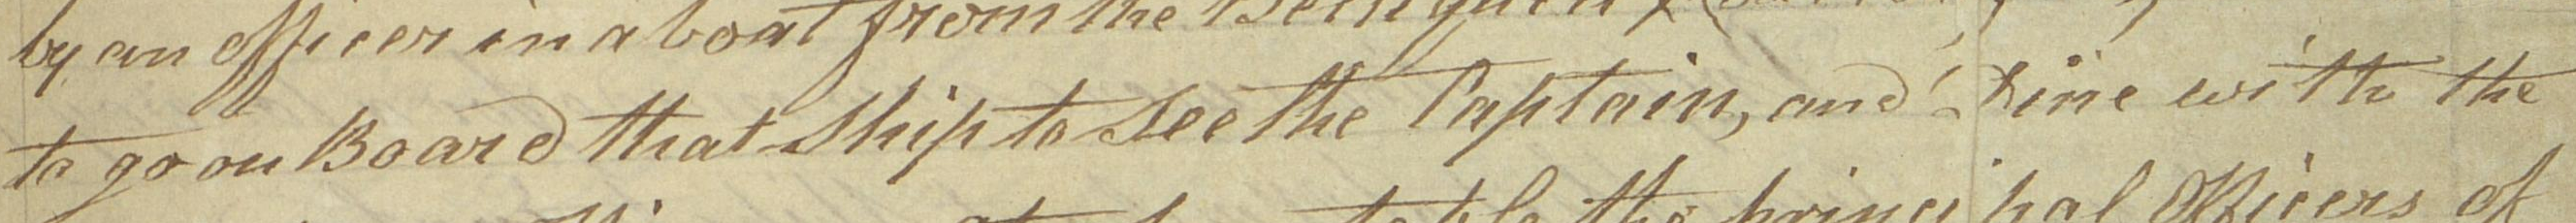to go on Board that Ship to see the Captain, and Dine with the
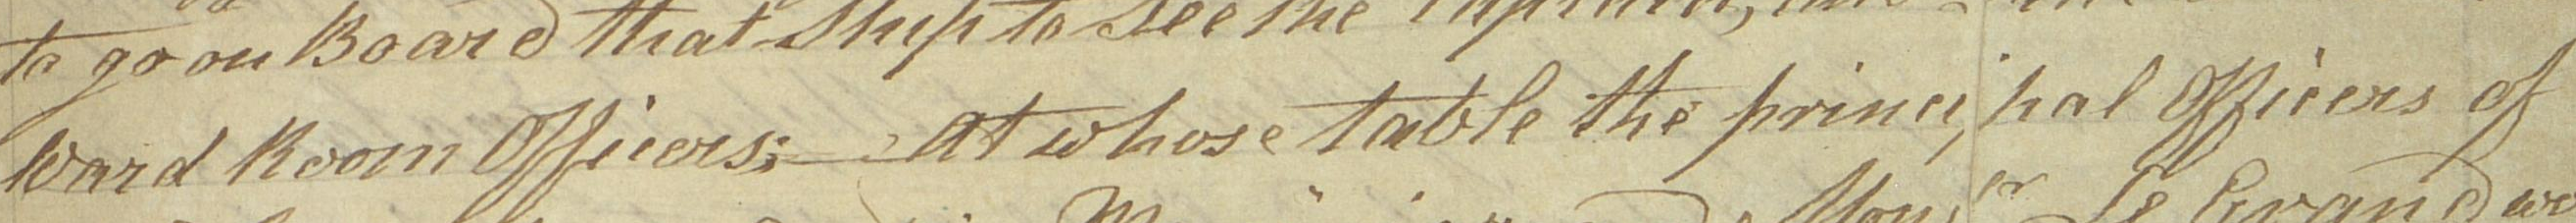ward Rom Officers: at whose table the prinicipal Officers of
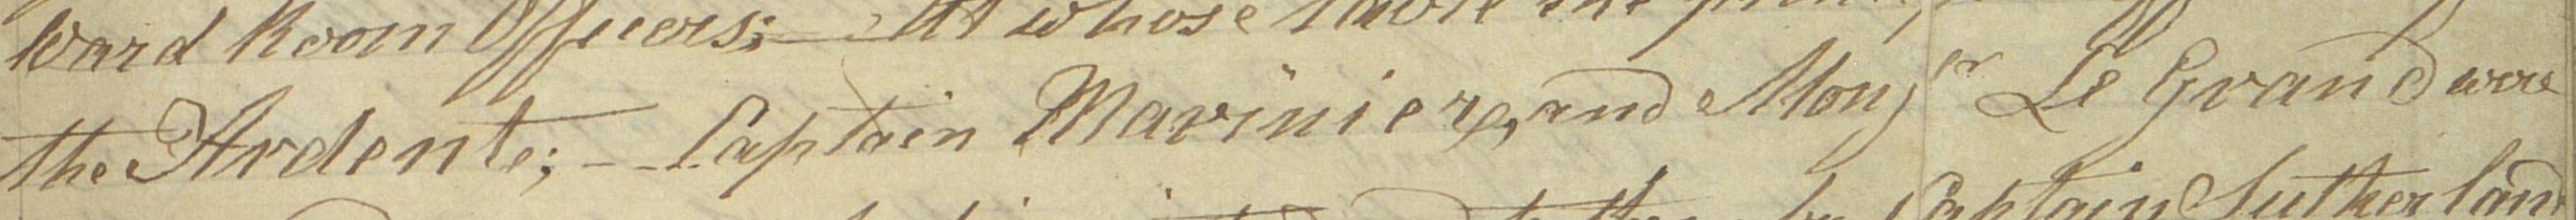the Ardent; Captin Marinier, and Mons^r Le Grand were
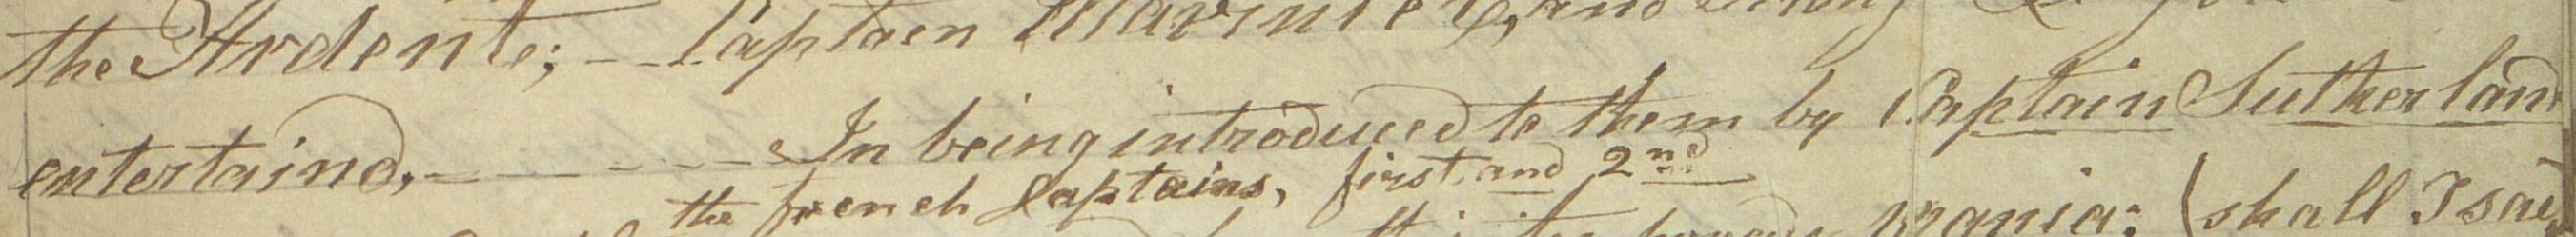entertaind, In being introduced to them by Captain Sutherland
